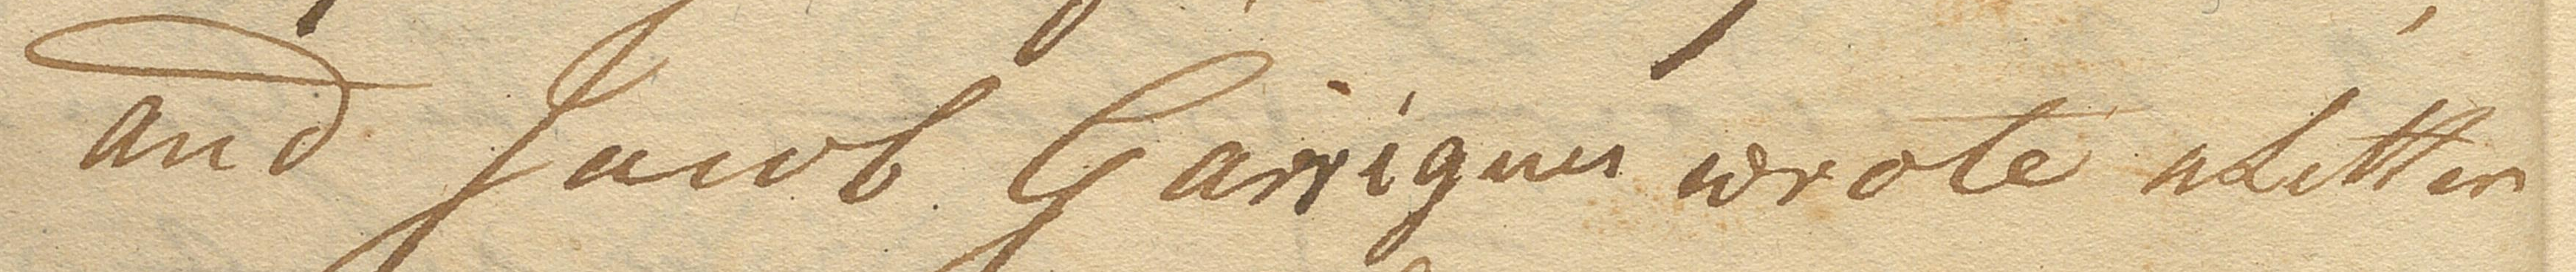and Jacob Garrigues wrote a Letter
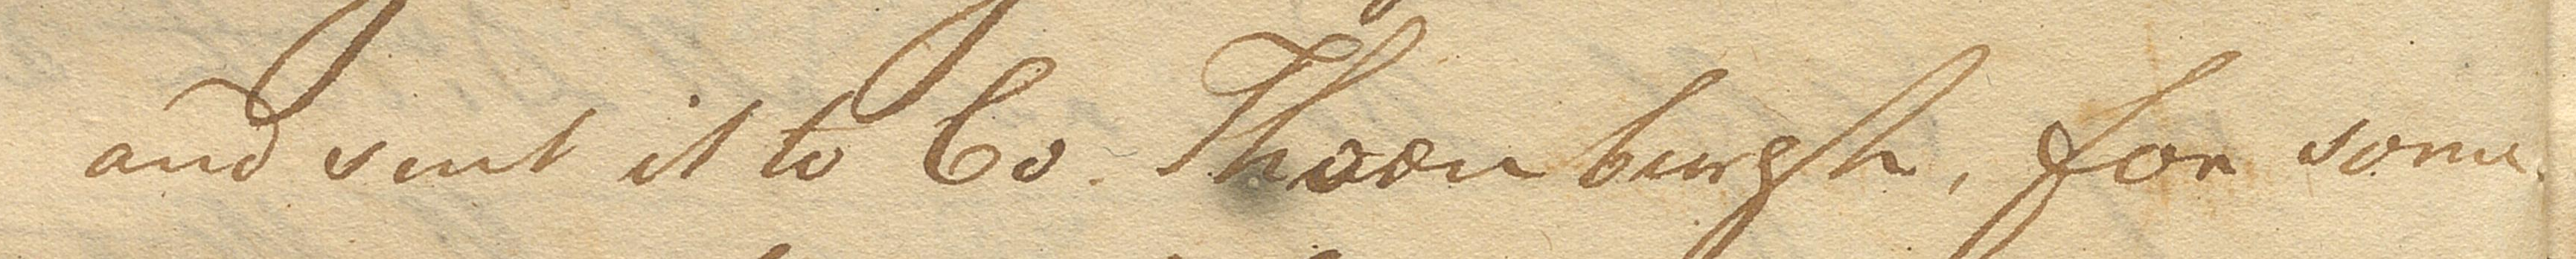and Jacob Garrigues wrote a Letter
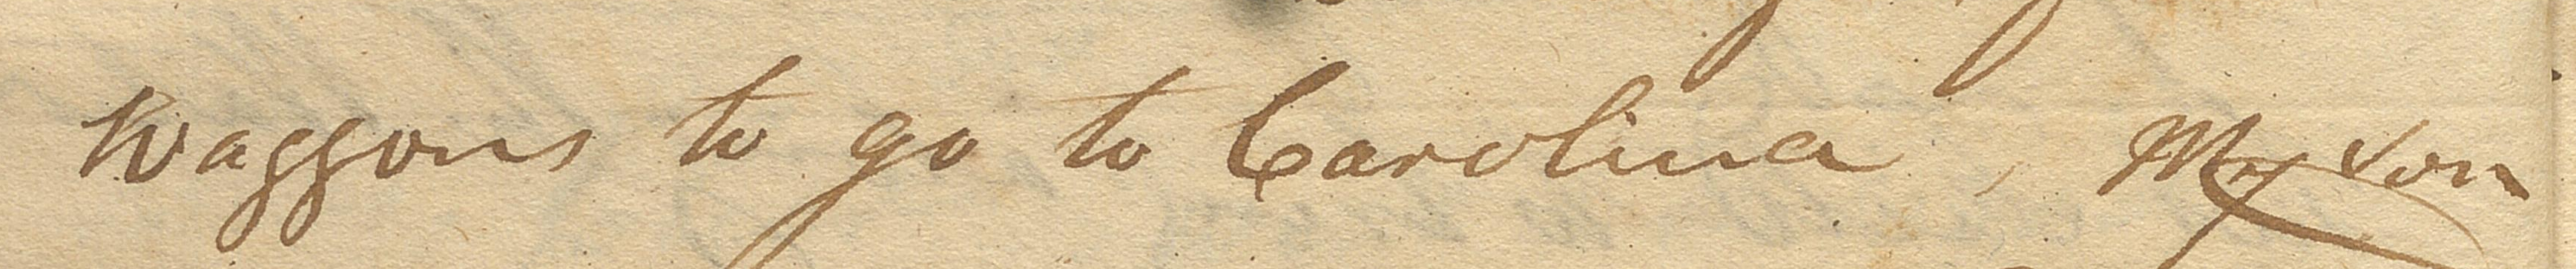waggons to go to Carolina, My son
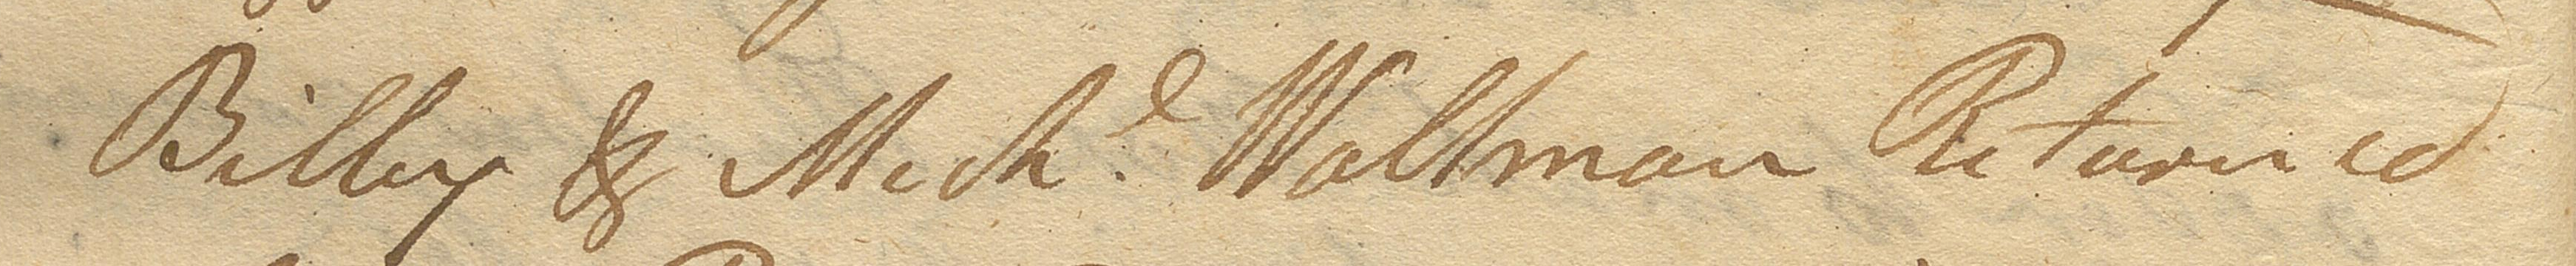Billey & Mich^l. Waltman Returned
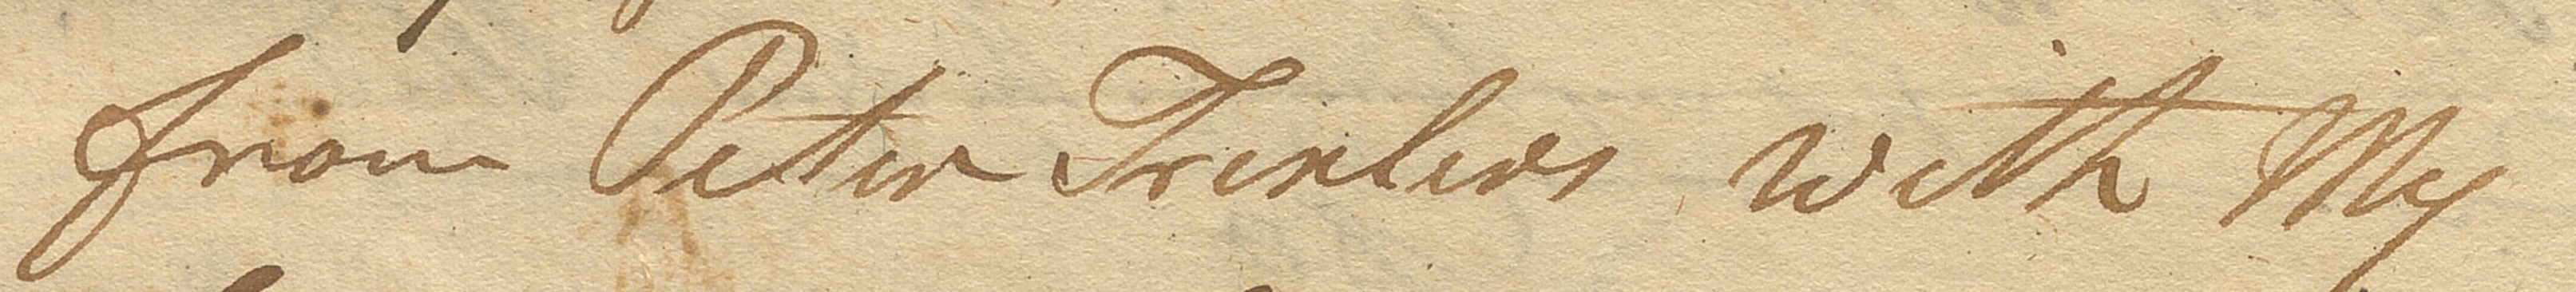from Peter Trenlers with My
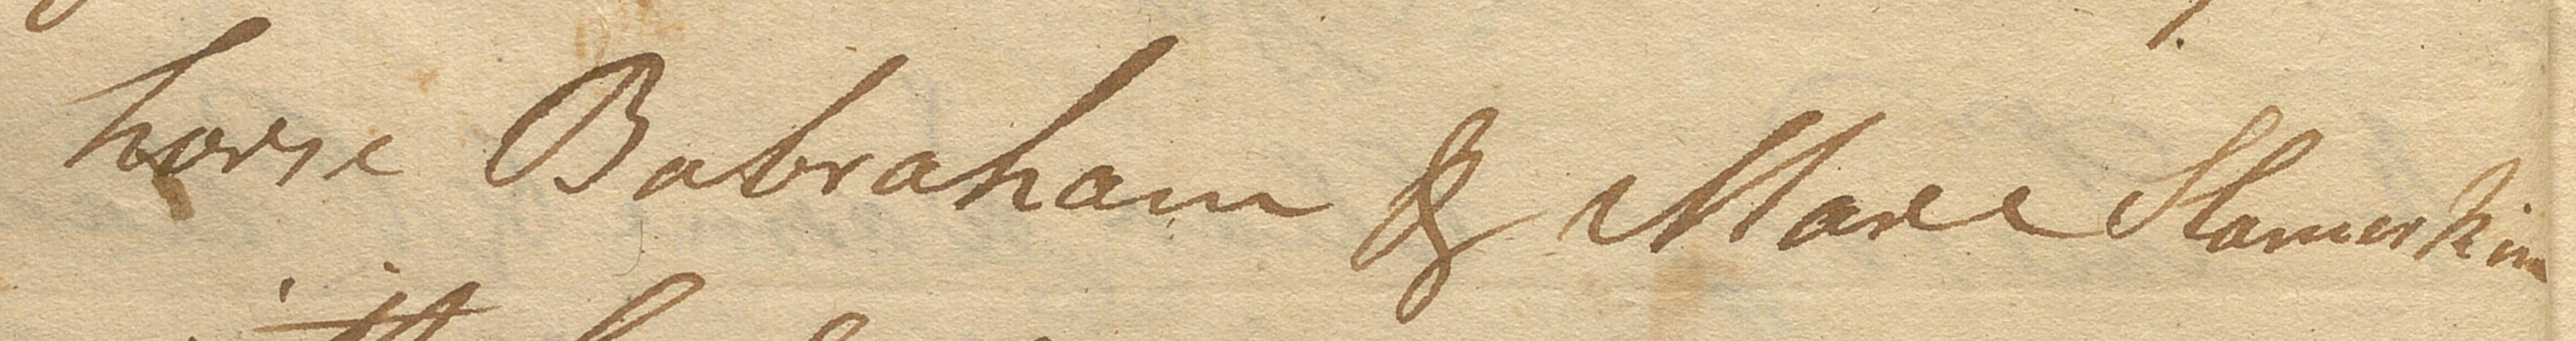horse Babraham & Mare Slamerkin
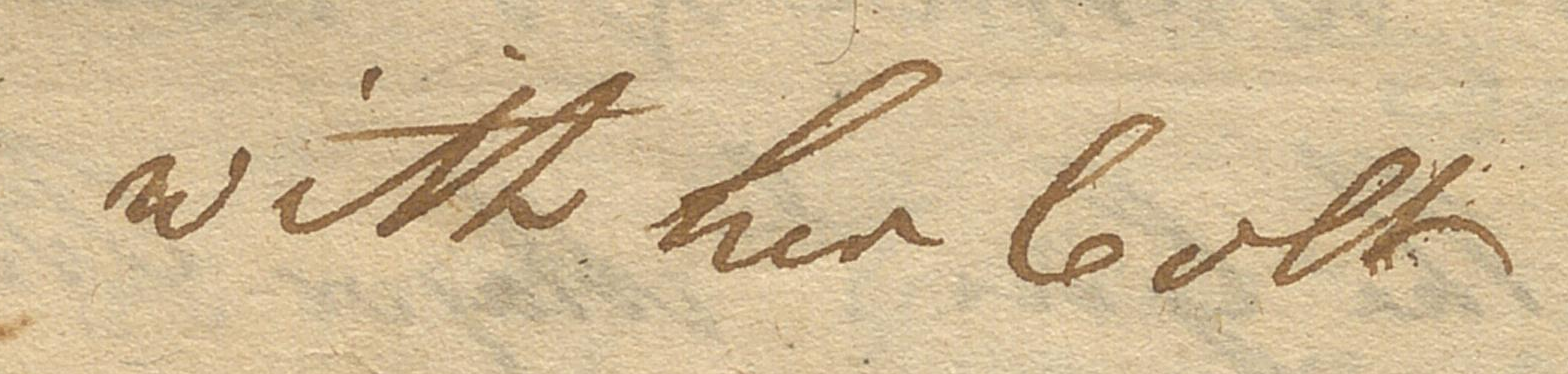with her Colt
